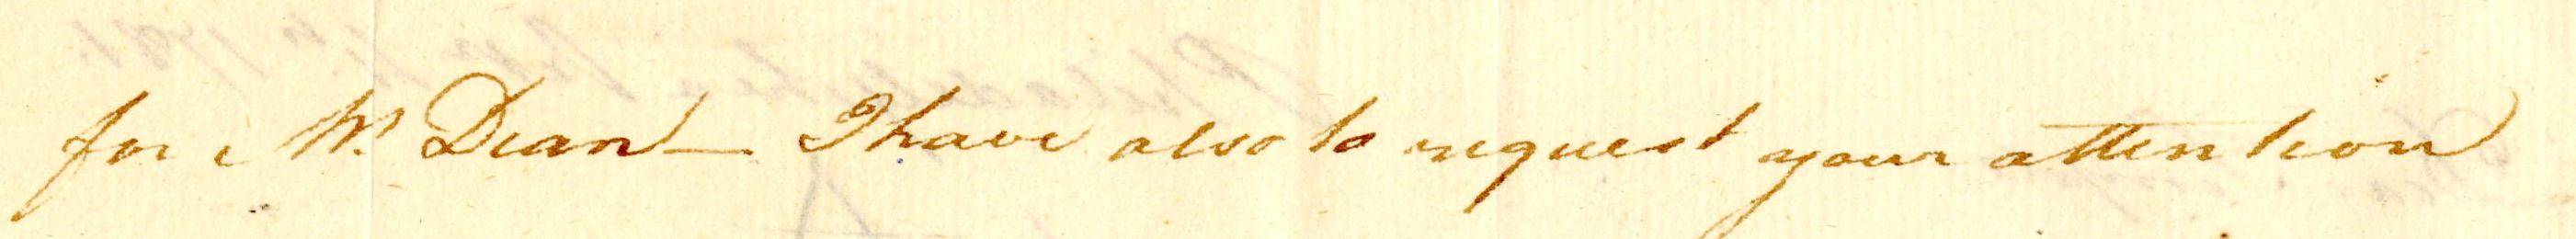for M^r. Dean- I have also to request your attention
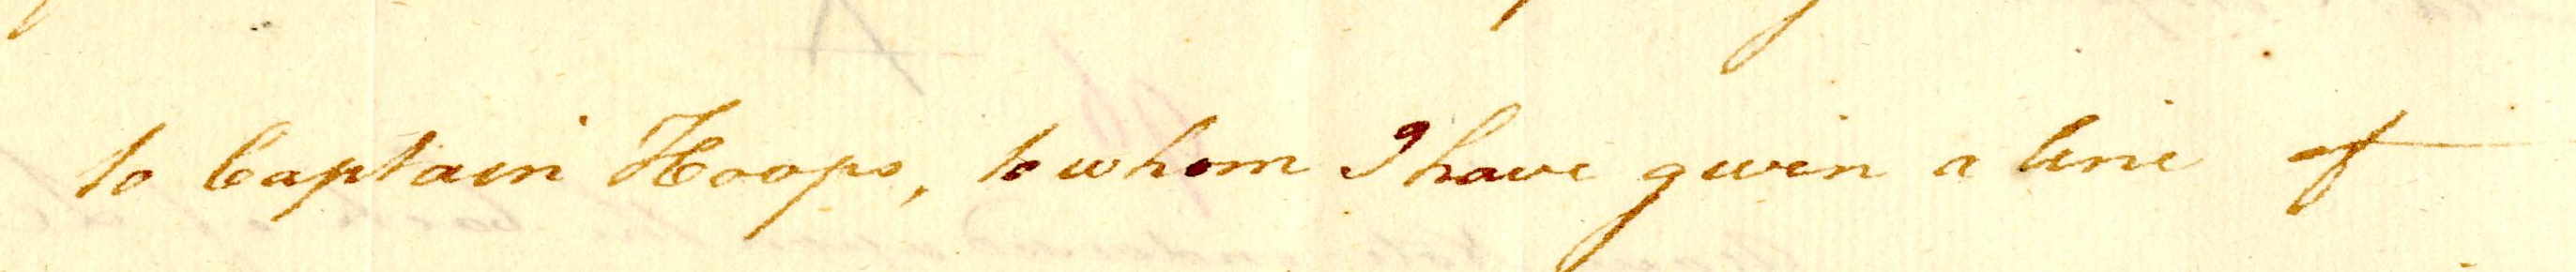to Captain Hoops, to whom I have given a line of
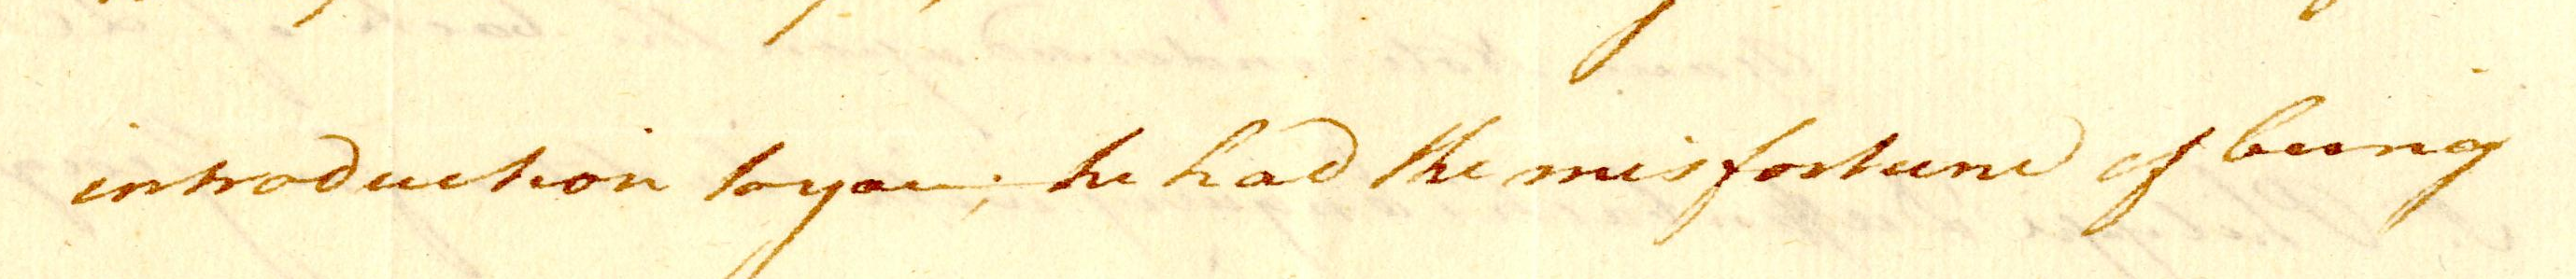introduction to you; he had the misfortune of being
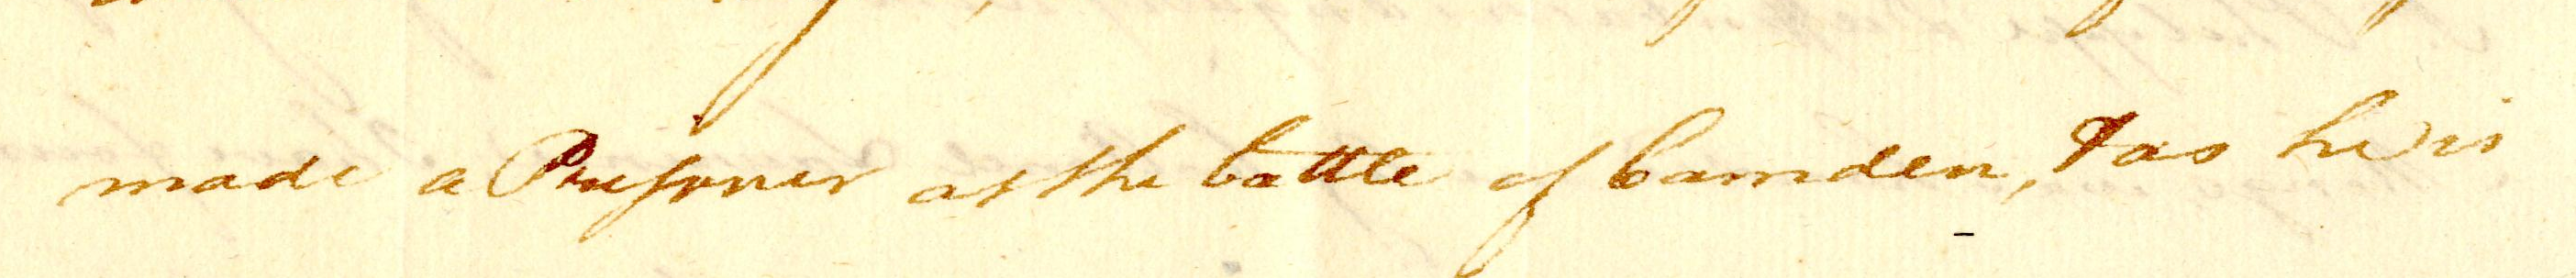made a Prisoner at the battle of Camden, & as he is
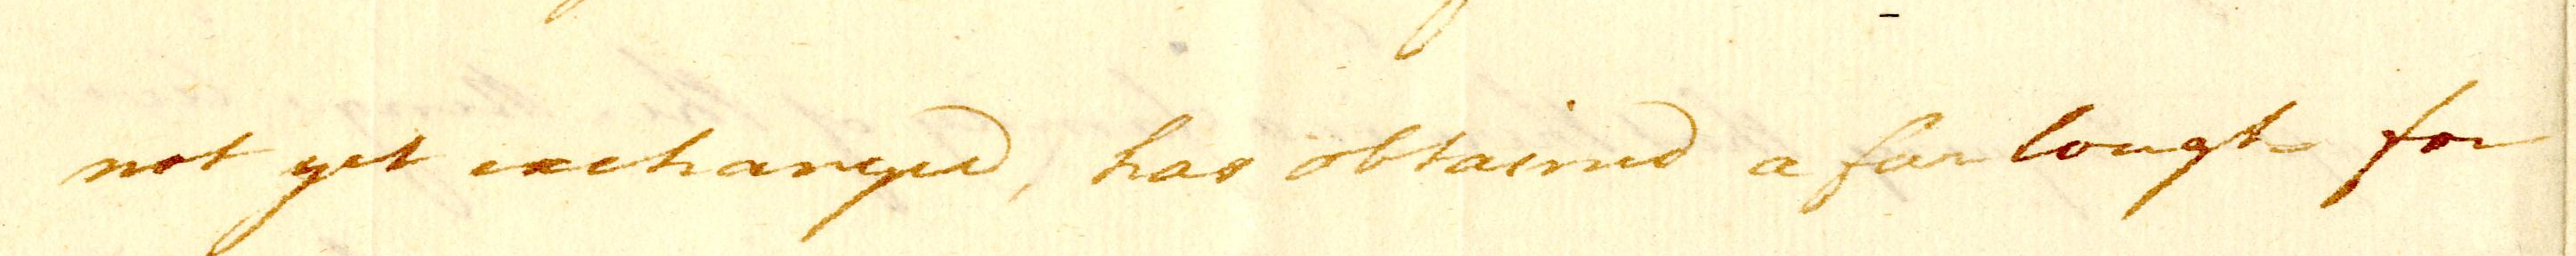not yet exchanged has obtained a furlough for
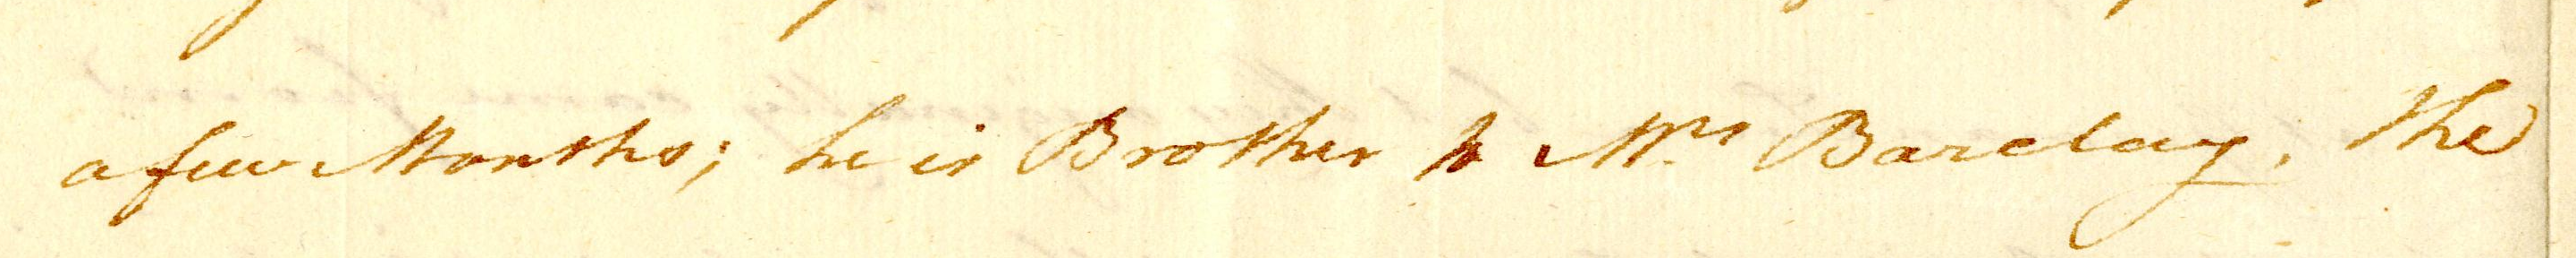a few Months; he is Brother to M^rs. Barclay, the
